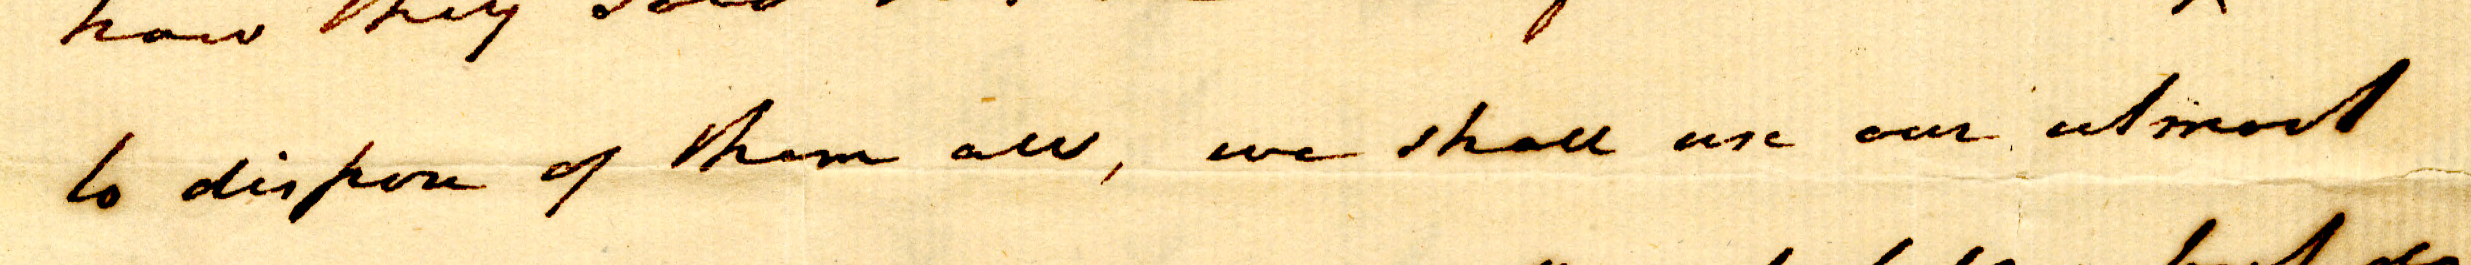to dispose of them all, we shall use our utmost
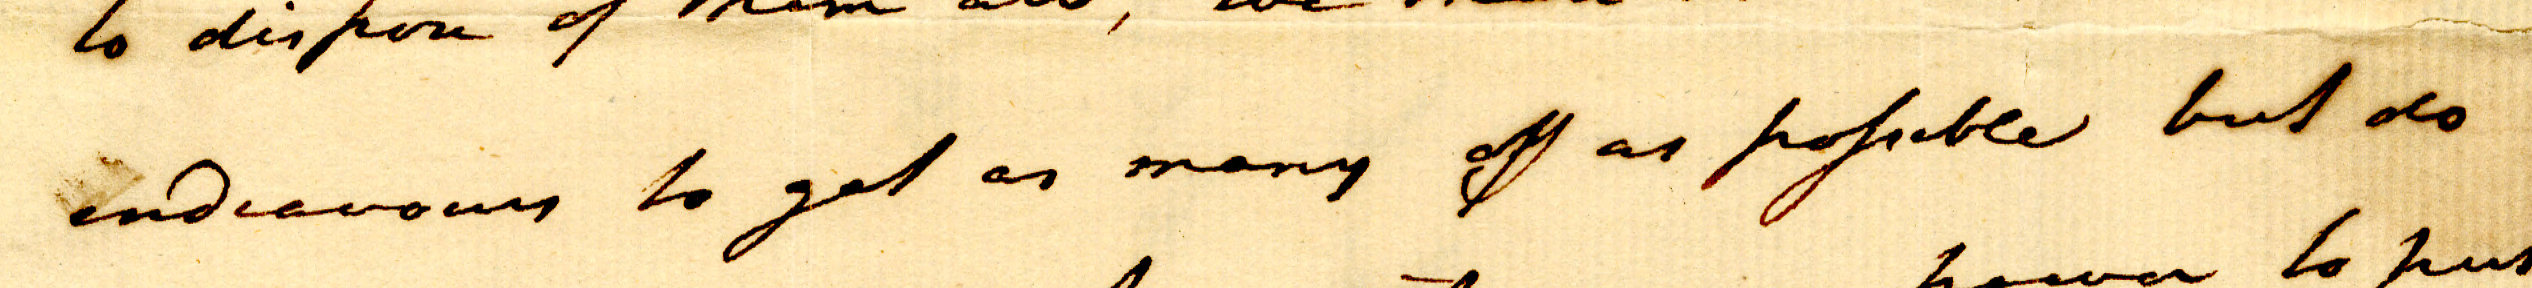endeavors to get as many off as possible but do
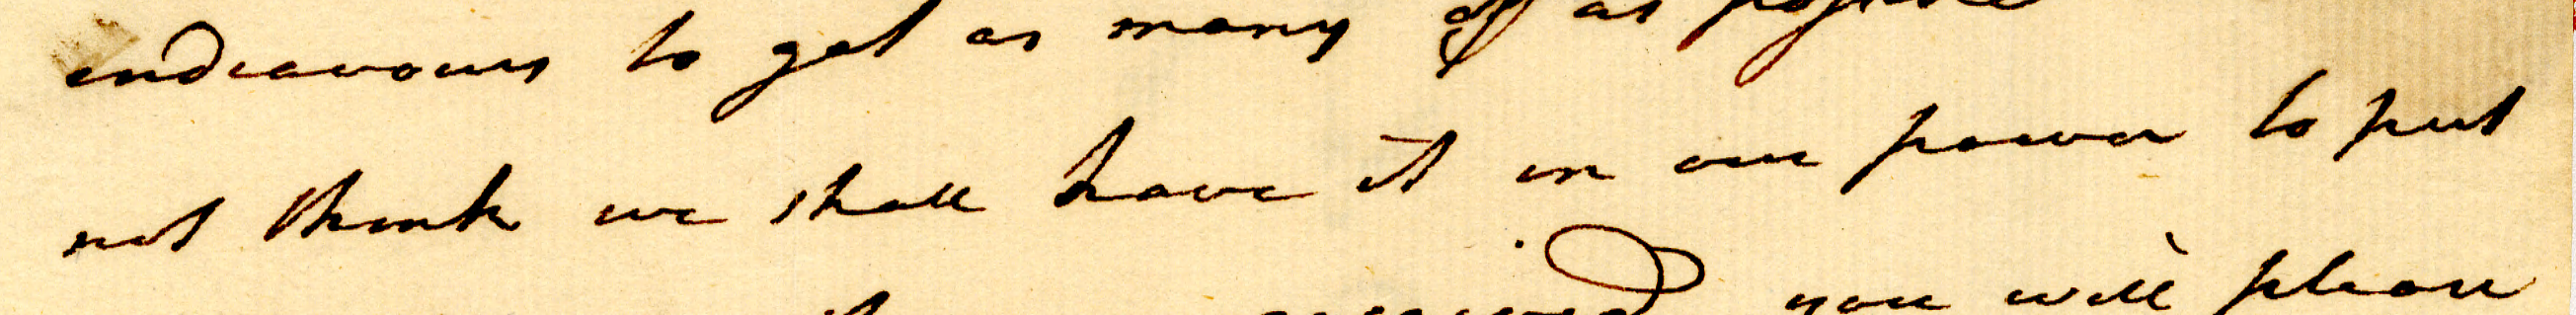not think we shall have it in our power to put
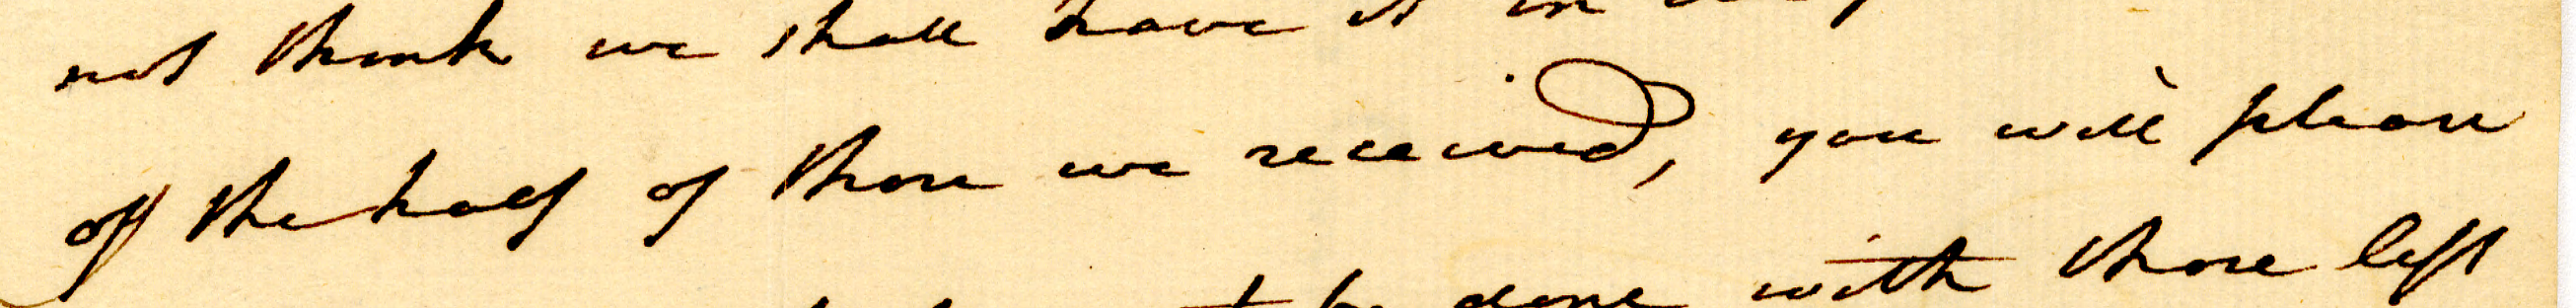of the Last of those we received, you will please
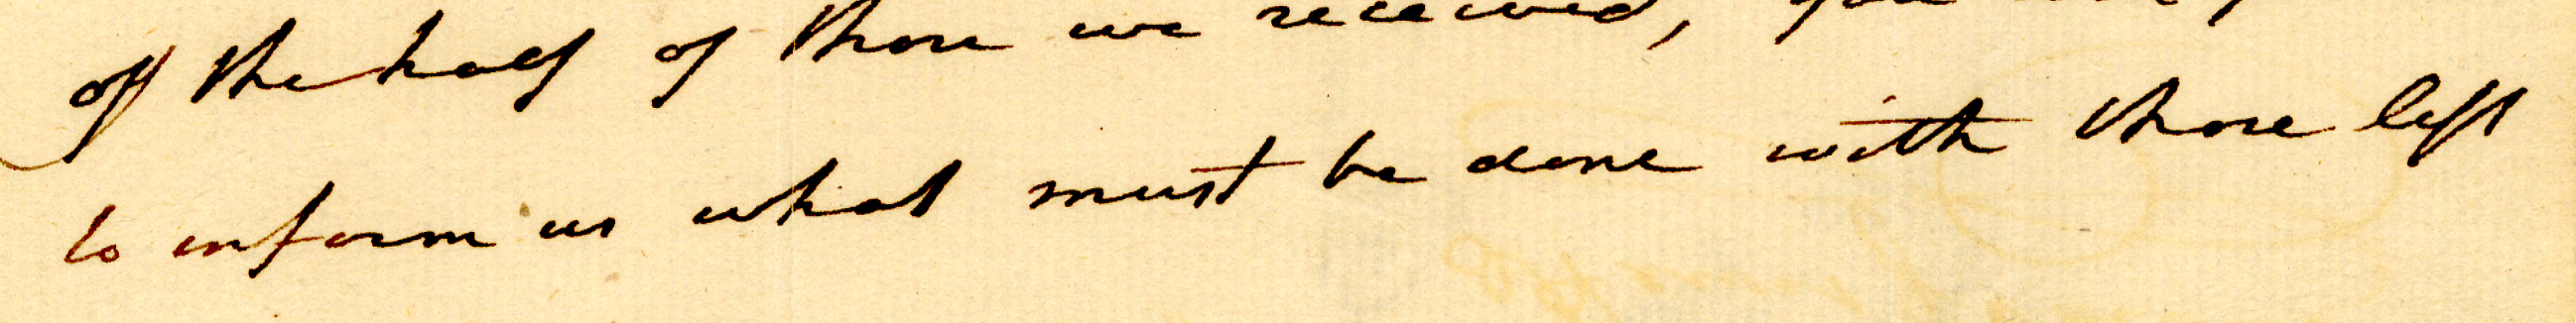to inform us what must be done with those left
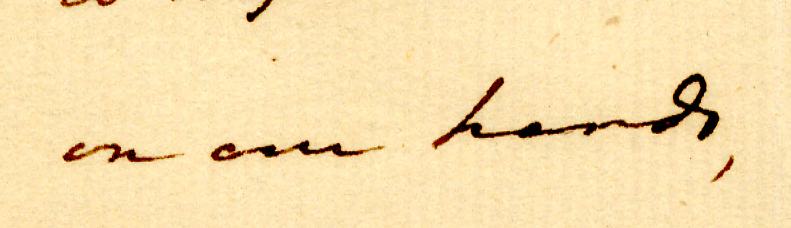in our hands,
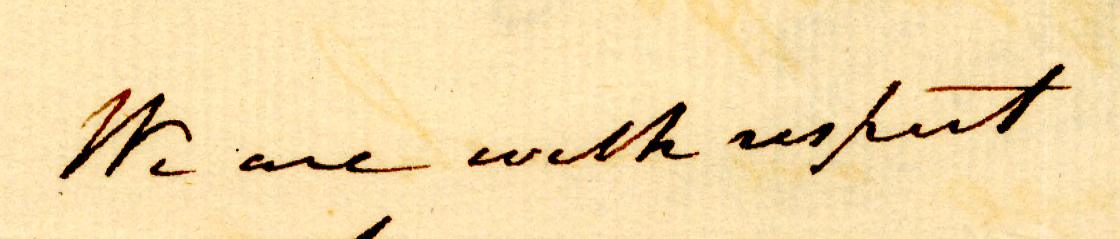We are with respect
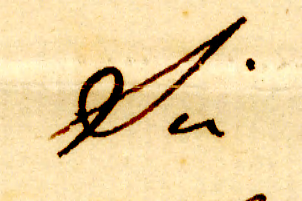Sir
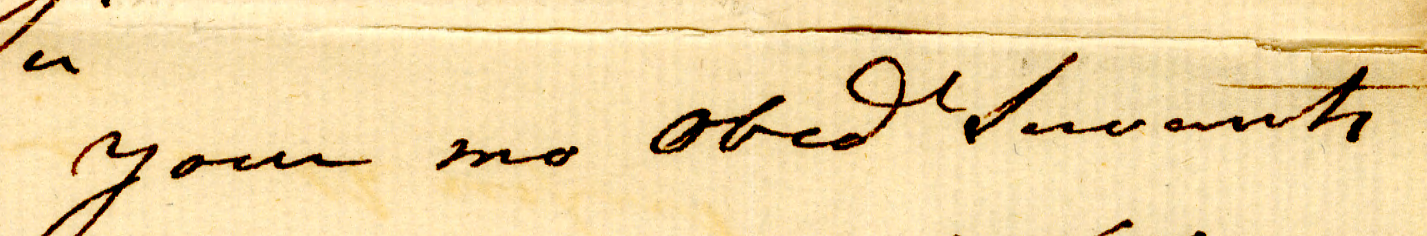Your mo obed^t servants
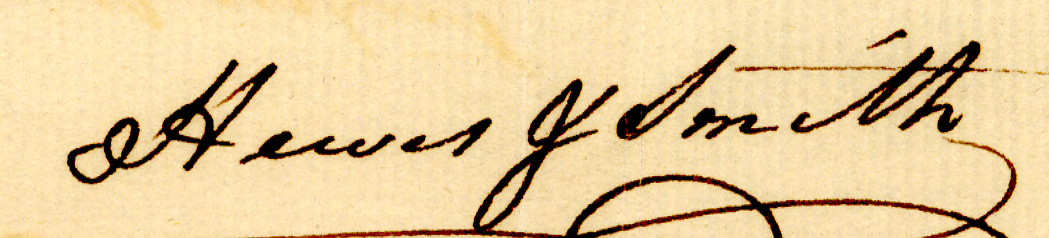Hewes & Smith
